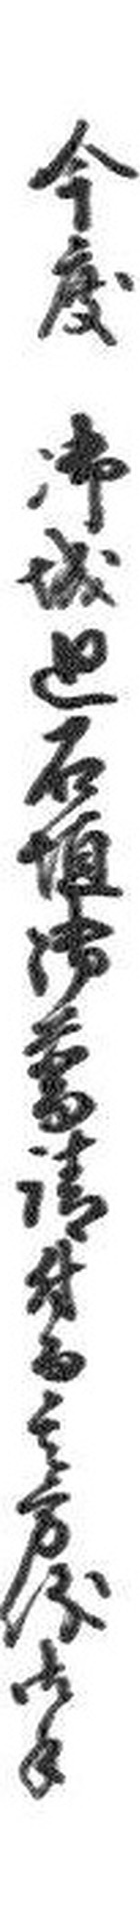今度御城廻石垣御普請付而其方儀御手

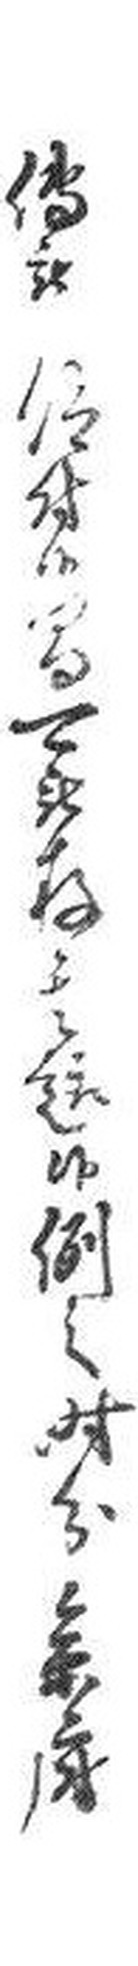伝被仰付候間可被存其趣候例之時分参府
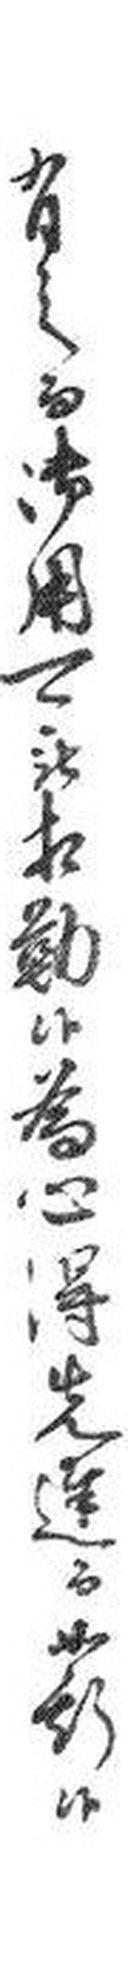有之而御用可被相勤候為心得先達而如斯候
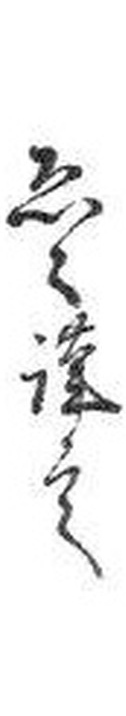恐々謹言
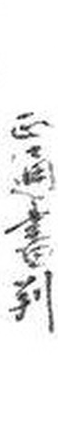正通書判
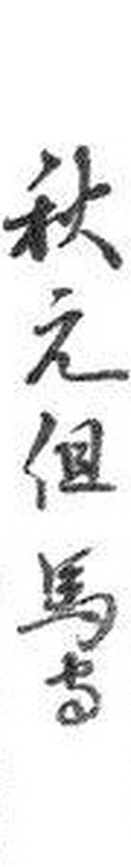秋元但馬守
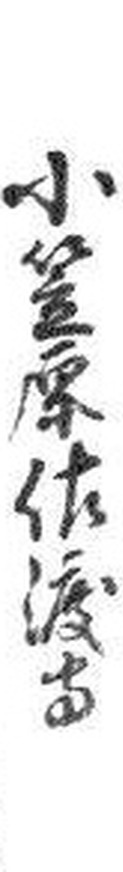小笠原佐渡守
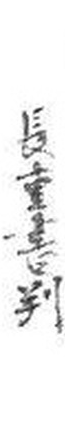長重書判
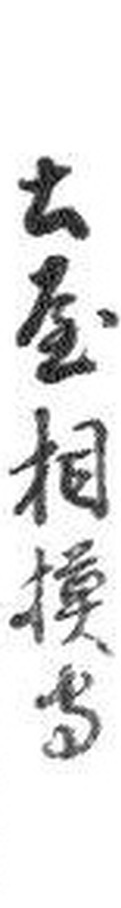土屋相模守
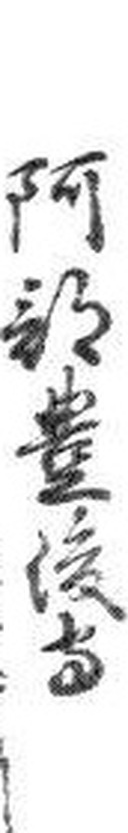阿部豊後守
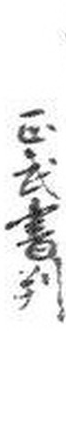正武書判
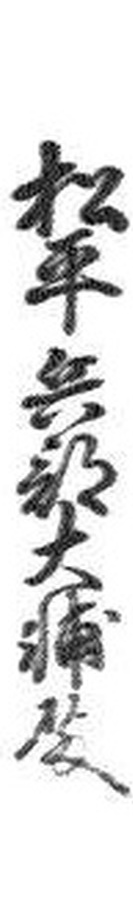松平兵部大輔殿
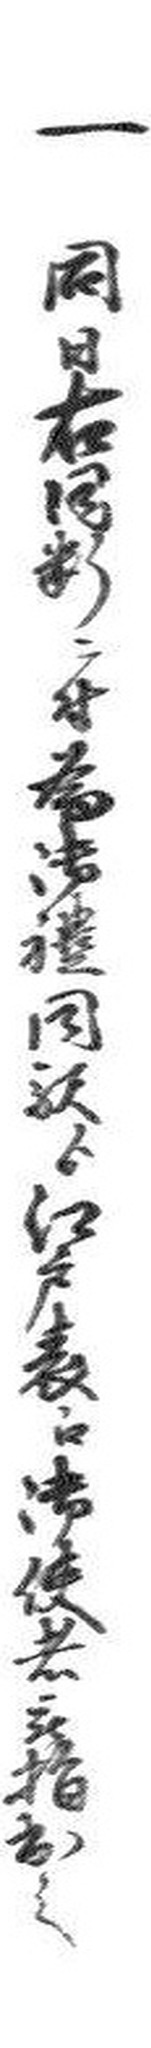一同日右同断ニ付為御礼同駅ゟ江戸表江御使者被指出之
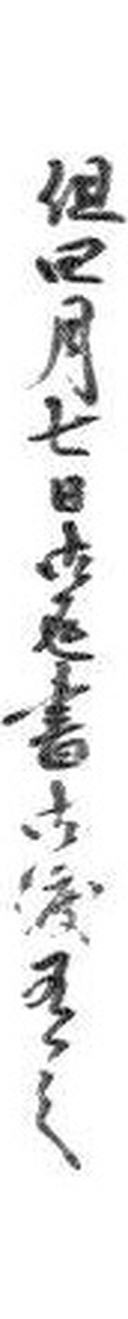但四月七日御返書御渡有之
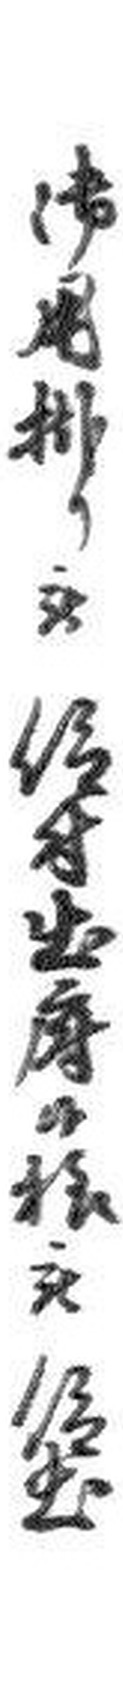御用掛り被仰付出府候様被仰出
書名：家譜 二十三 吉品公 従宝永元年到同二年
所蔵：福井県文書館 Fukui Prefectural Archives
